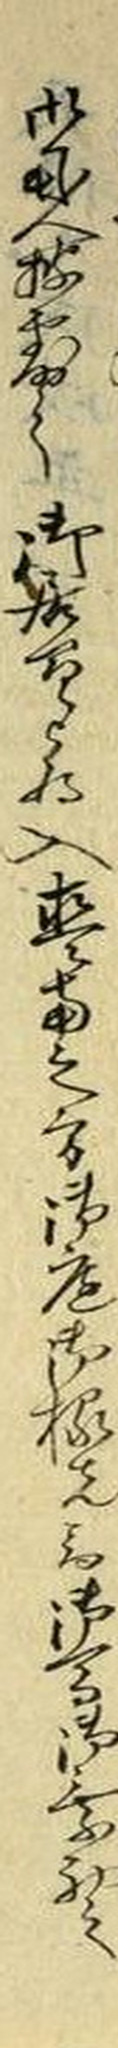御用人披露之御居間へ被為入直々南之方御庭御縁先ニ而御馬御乗初之
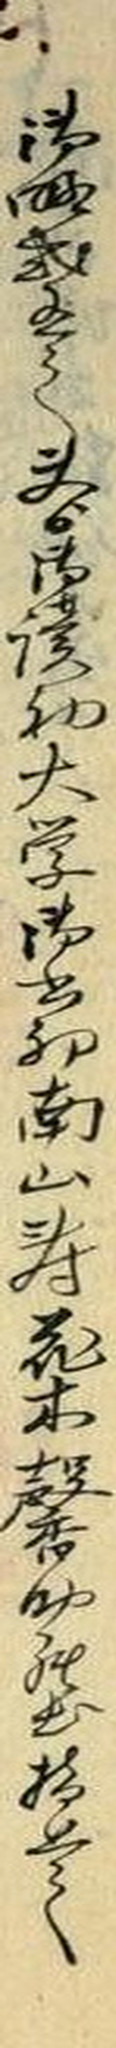御略式有之夫ゟ御読初大学御書初南山寿花木馨助罷出指上之
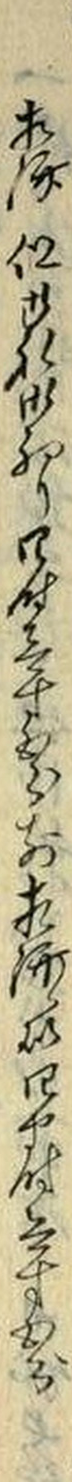相済但御礼御初り四時壱寸五分前相済候処四半時壱寸五分
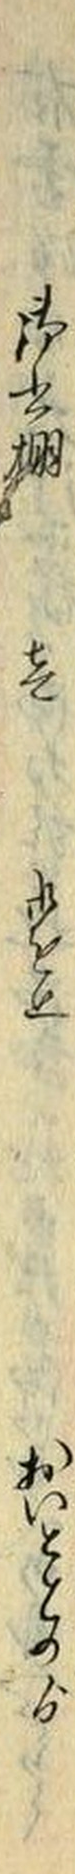御書棚壱御進上おいととのゟ
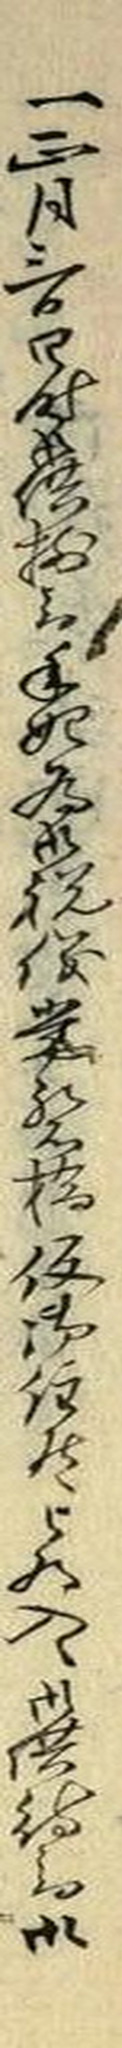一正月三日四時御供揃ニ而年始為御祝儀常磐橋仮御住居へ被為入候御供待ニ而御
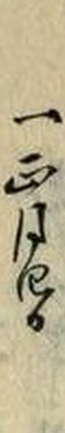一正月四日
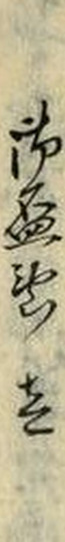御盃台壱
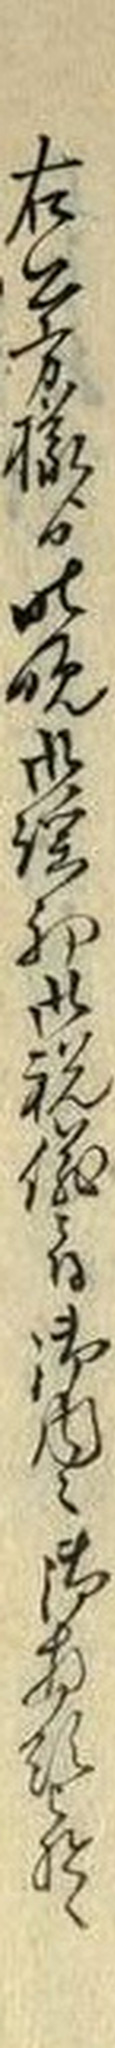右公方様ゟ昨晩御謡初御祝儀ニ付御内々御拝領被遊候
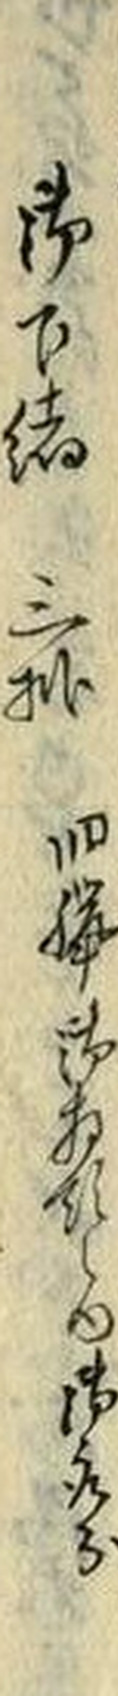御下緒三掛旧臘御拝領之内御取分
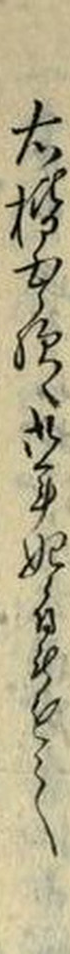右楷五郎様へ御年始ニ付被進之
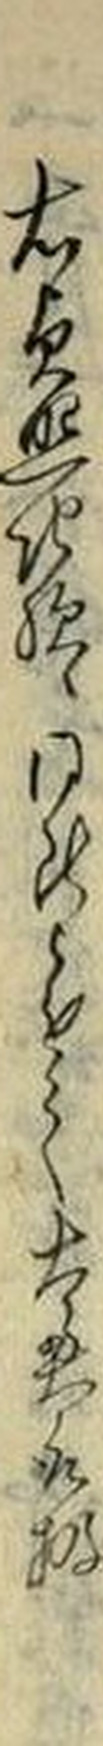右貞照院様へ同断被進之大奥取扱
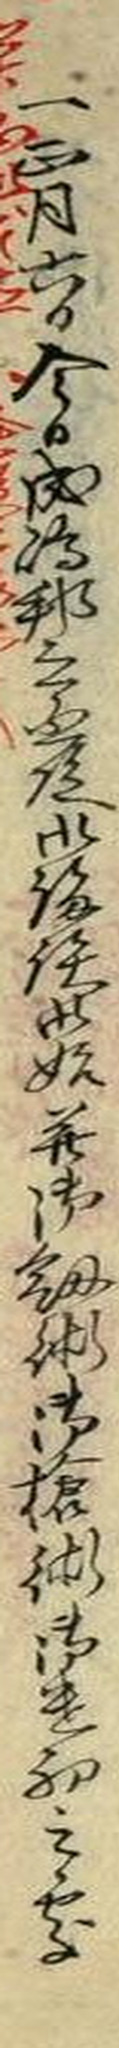一正月六日今日成島邦之丞殿御講談御始御剱術御槍術御遣初之処

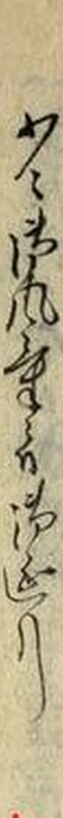少々御風気ニ付御延引
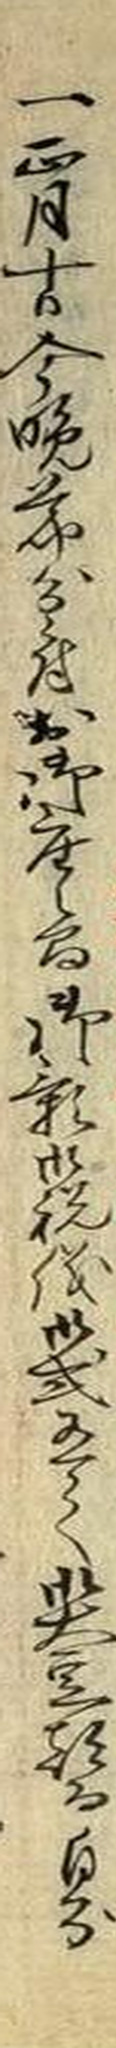一正月十日今晩節分ニ付於御座之間御影御祝儀御式有之御大豆都而自分
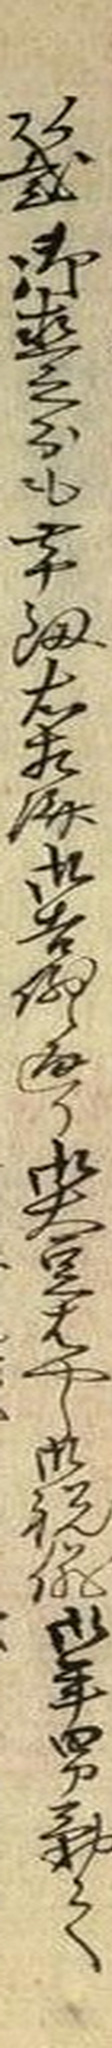頂戴御直之分も帯紐右相済御吉例之通り御大豆はやし御祝儀御年男勤之
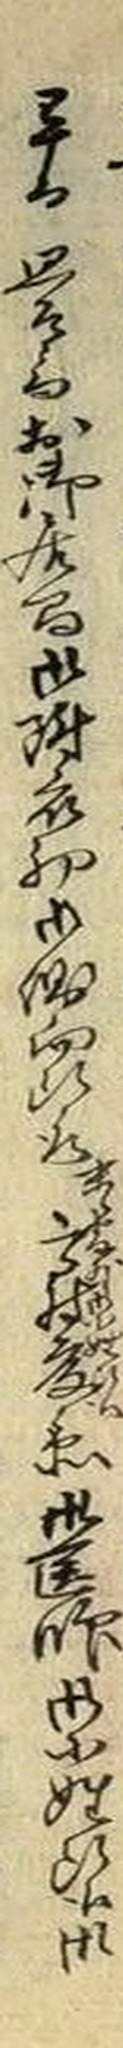畢而思召ニ而於御居間御附衆初御側向頭取末之番外御小姓頭取高村藤兵衛御医師御小姓頭取御
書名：少傅日録抄（斉善付側向頭取日記、江戸并道中、初入在国、逝去後…
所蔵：福井県文書館 Fukui Prefectural Archives
